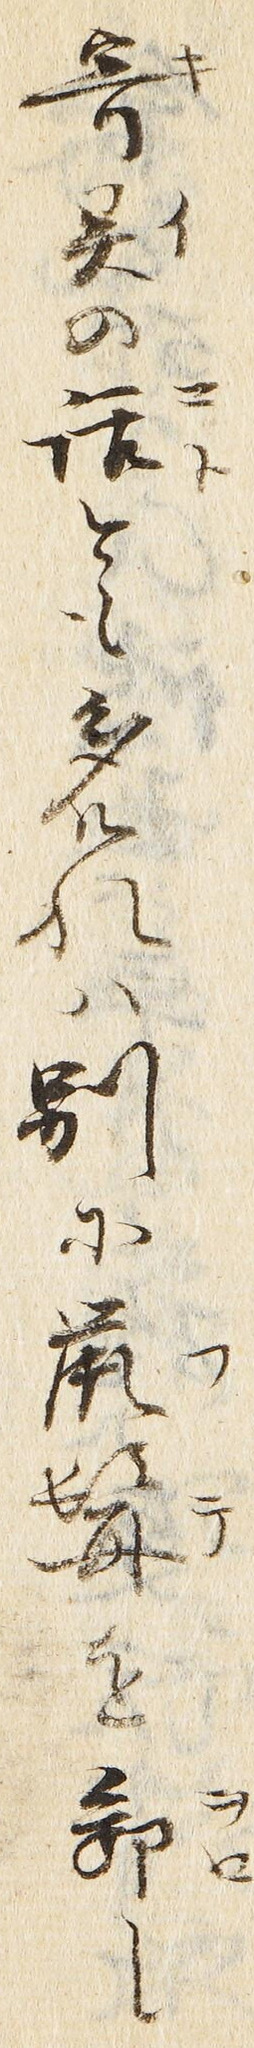奇異の話とも多けれは別に鼠髯を卸し
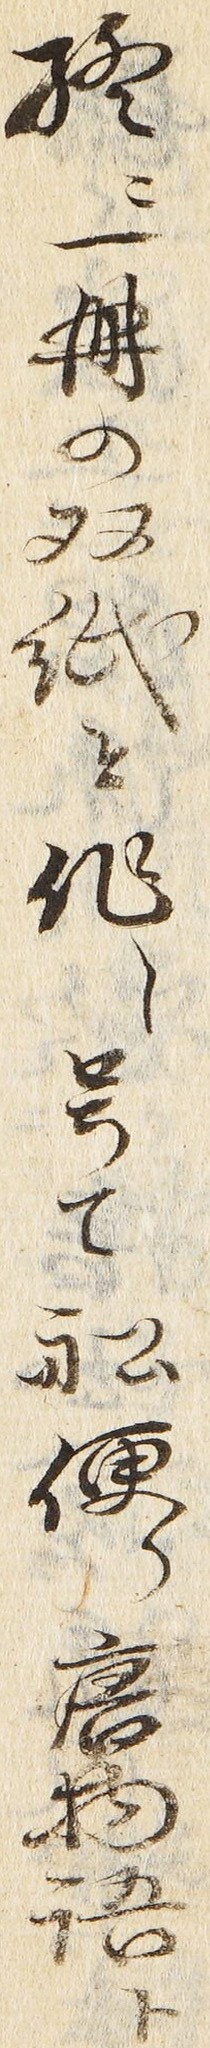終一冊の双紙を作し号て船便り唐物語ト
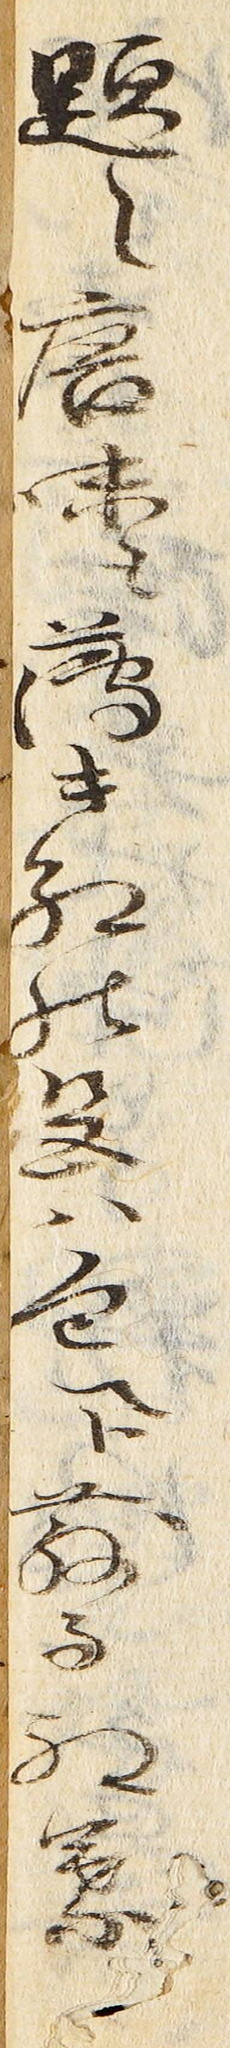題し唐味と薄キ紅の色は色ヘト散る紅葉
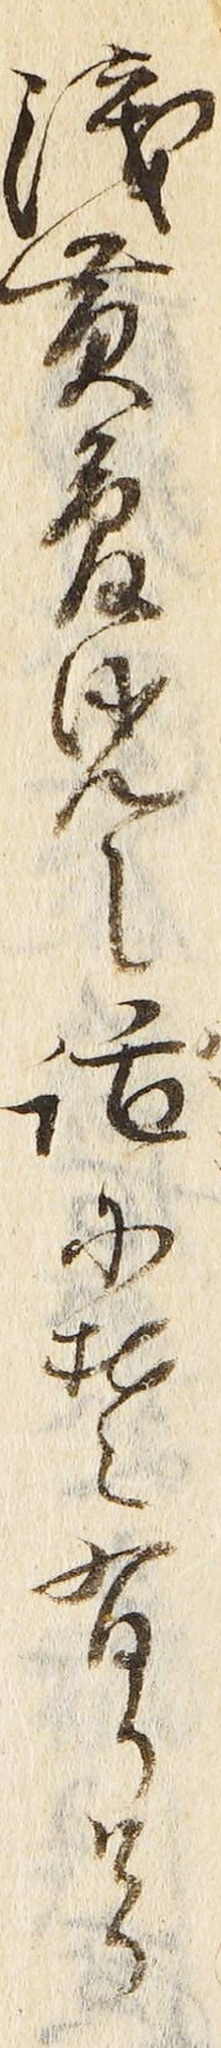浅黄夢見し話にそ有りけり
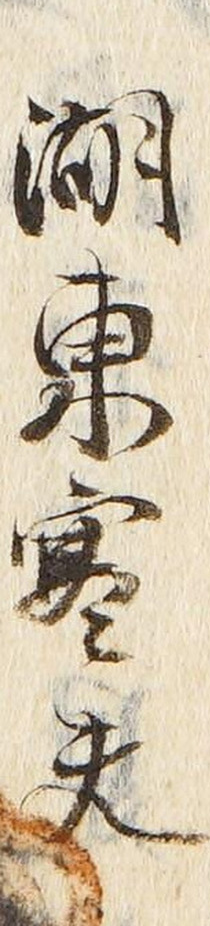湖東寒夫
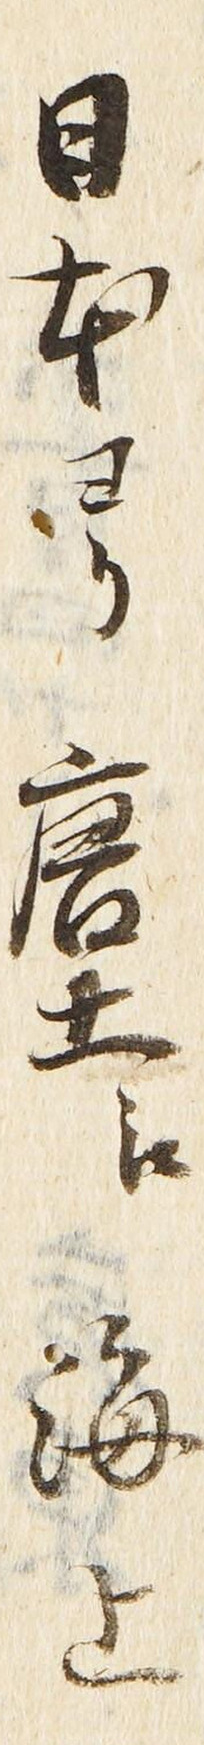日本ヨリ唐土え海上
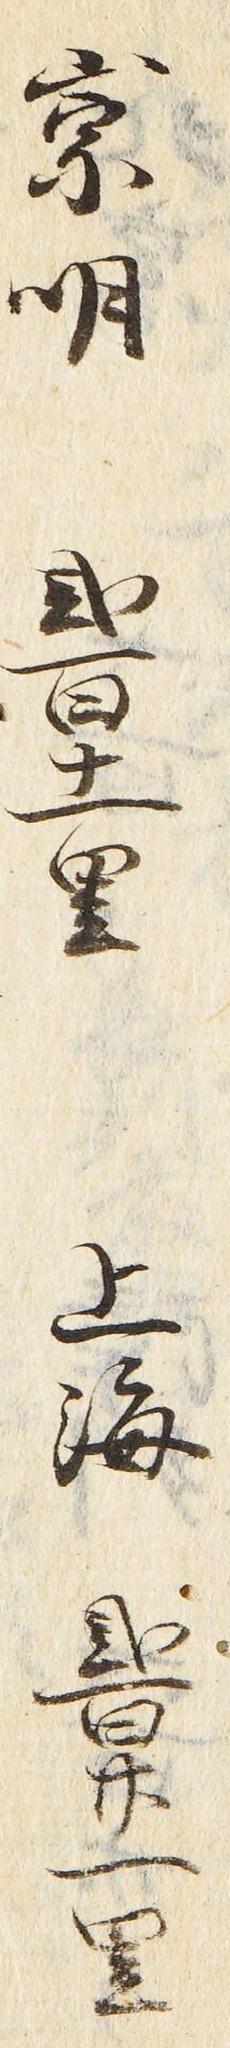崇明弐百十一里上海弐百廿一里
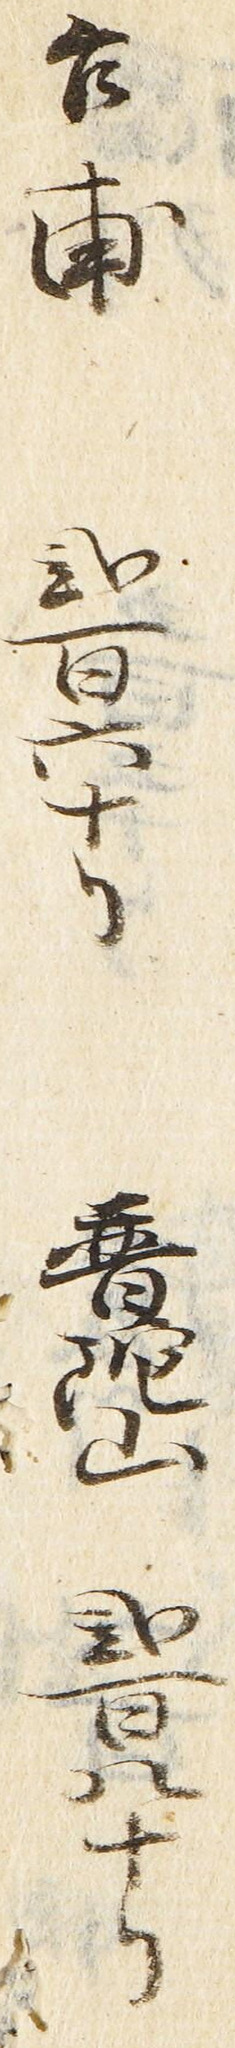台甫弐百六十り普陀山弐百八十り
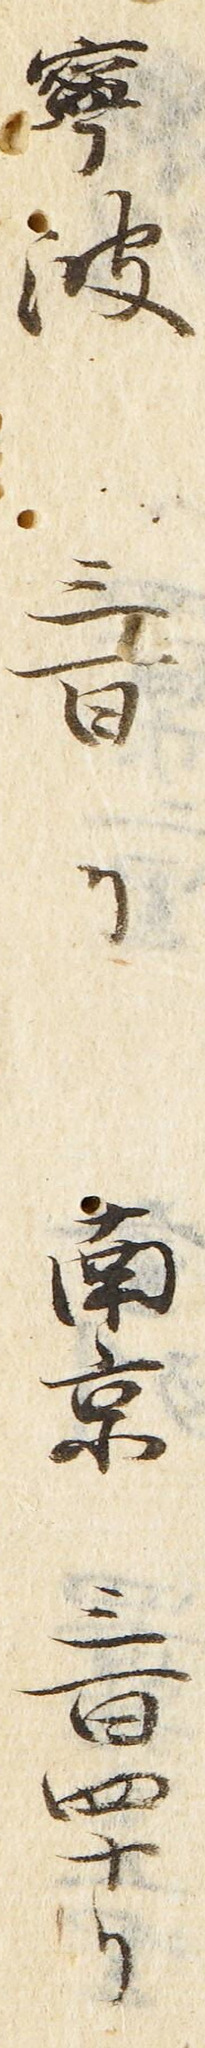寧波三百り南京三百四十り

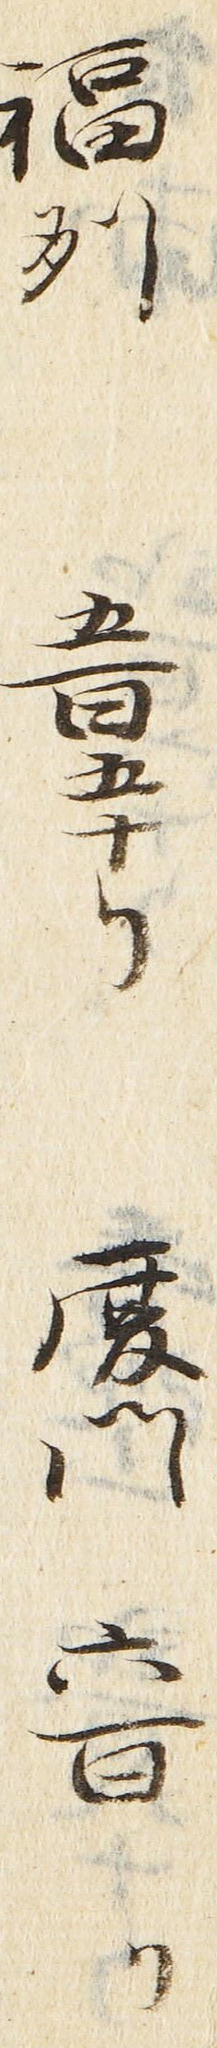福州五百五十り厦門六百り
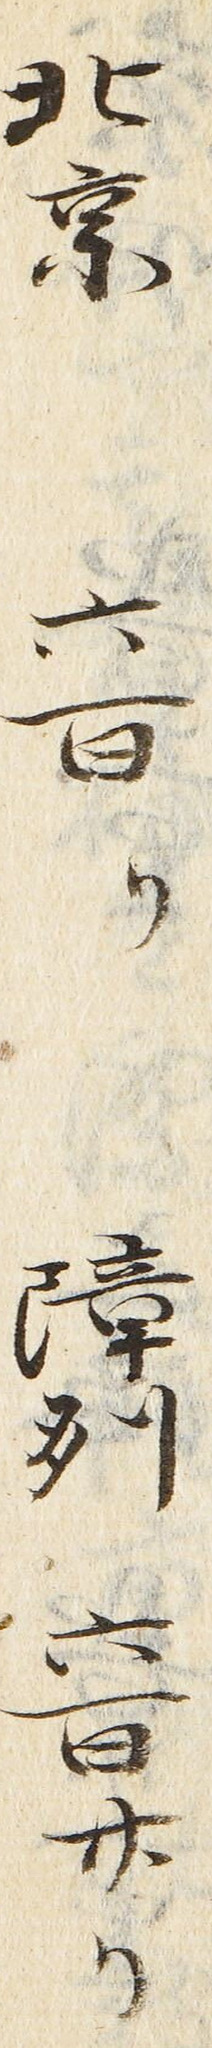北京六百り障州六百廿り
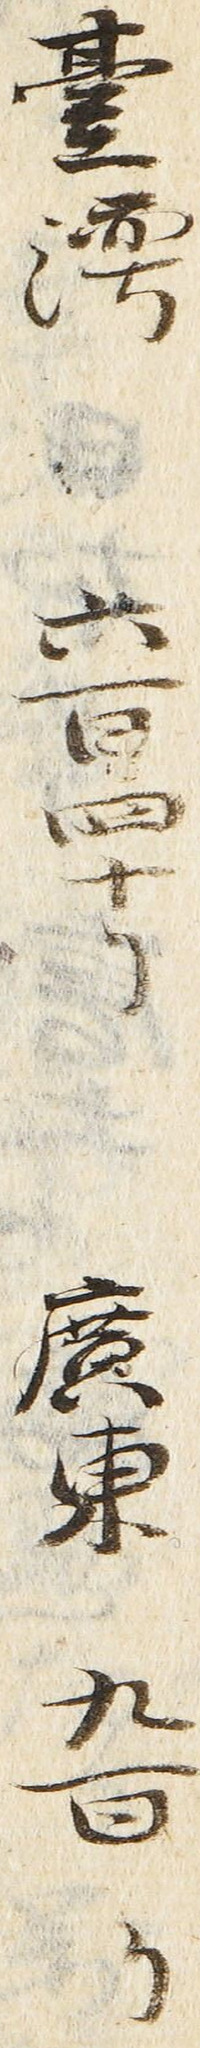台湾六百四十り広東九百り
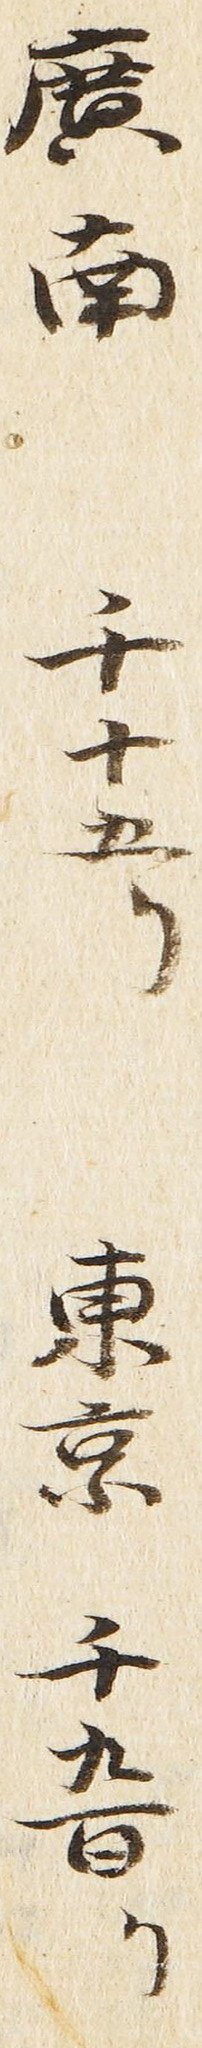広西千十五り東京千九百り
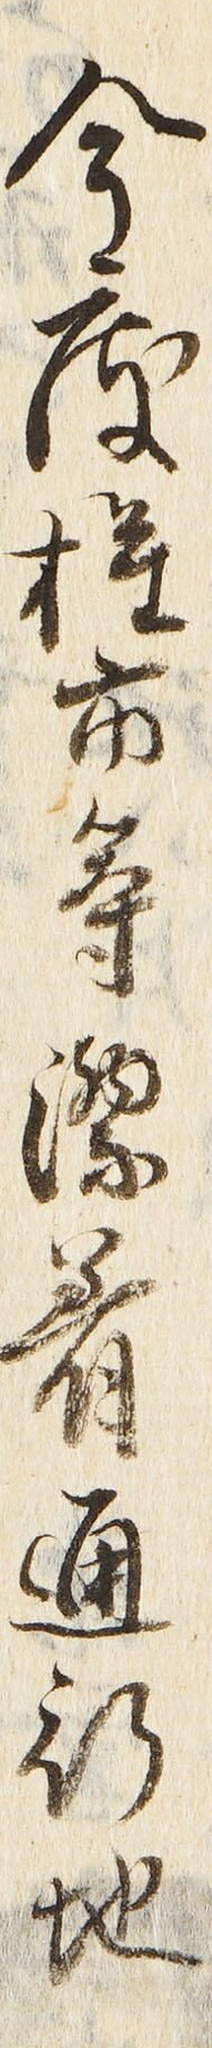今度権市等漂着通行地
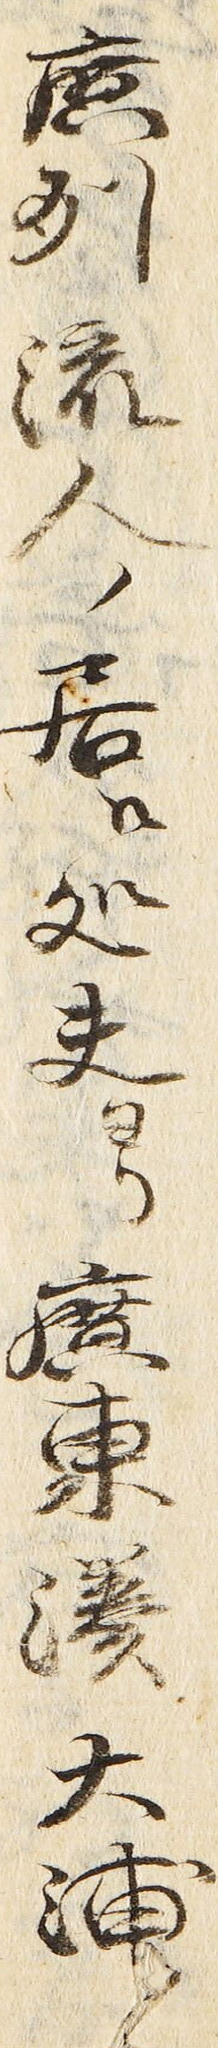広州流人ノ居ル処夫ヨリ広東湊大浦
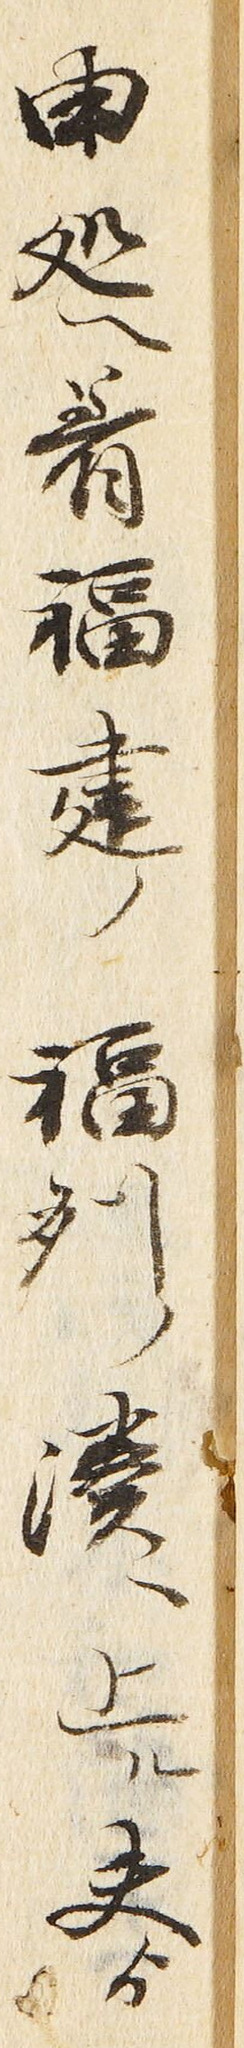申処へ着福建ノ福州ノ湊ヘ上ル夫ゟ
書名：唐物語
